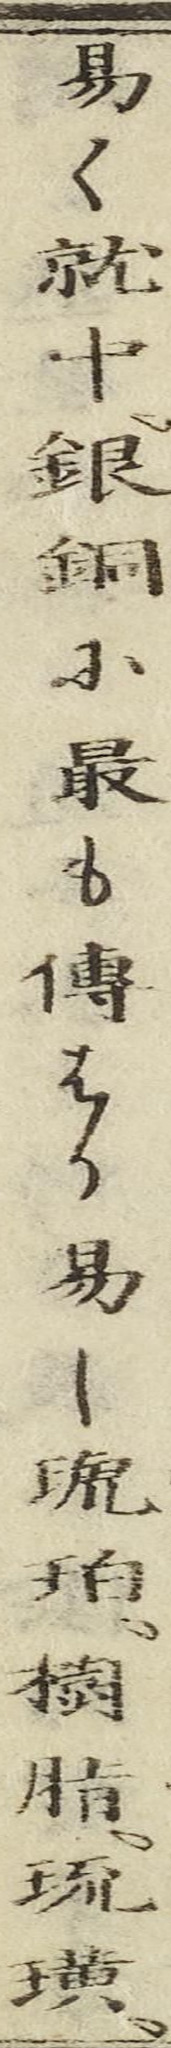易く就中。銀銅に最も伝はり易し琥珀。樹脂。琉璜。
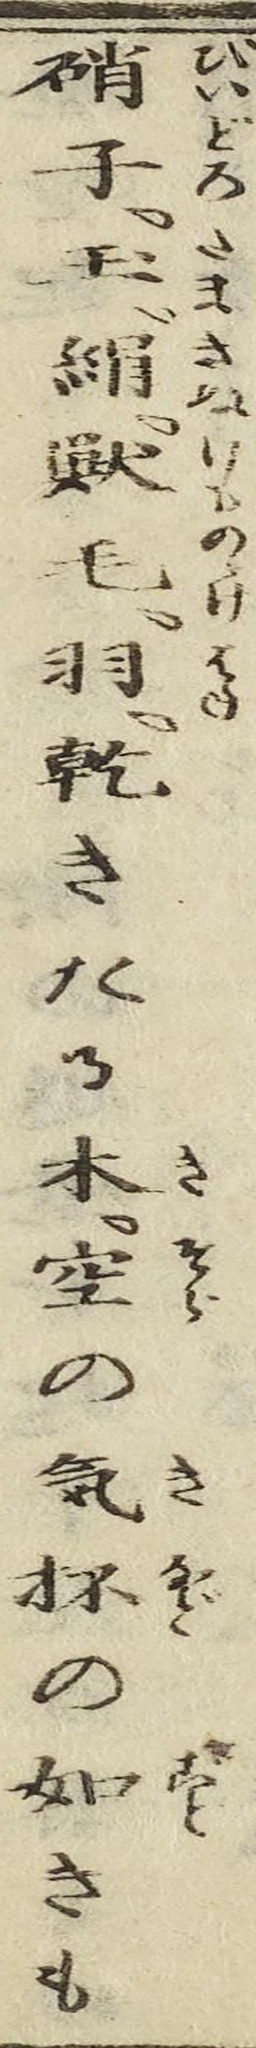硝子。玉。絹。獣毛。羽。乾きたる木。空の気抔の如きも
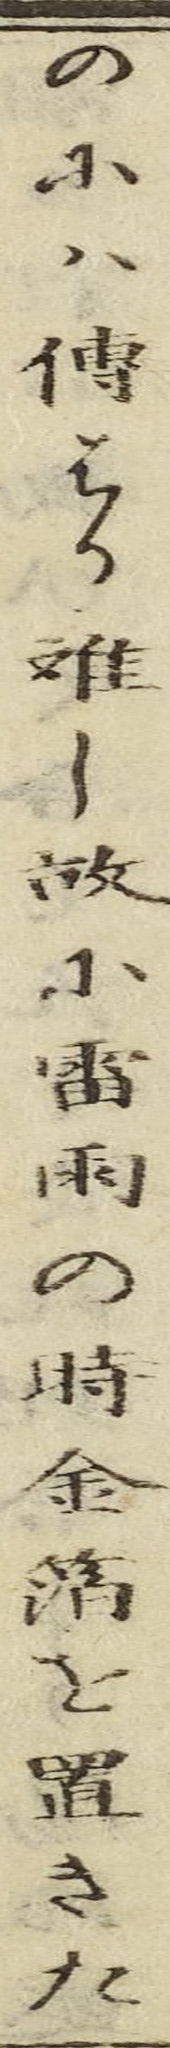のには伝はり難し故に雷雨の時金箔を置きた
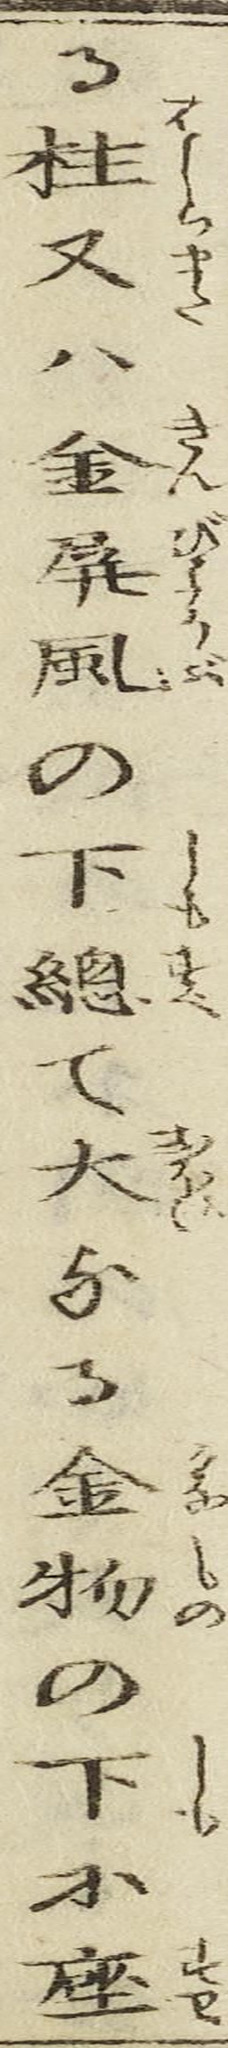る柱又は金屏風の下総て大なる金物の下に座
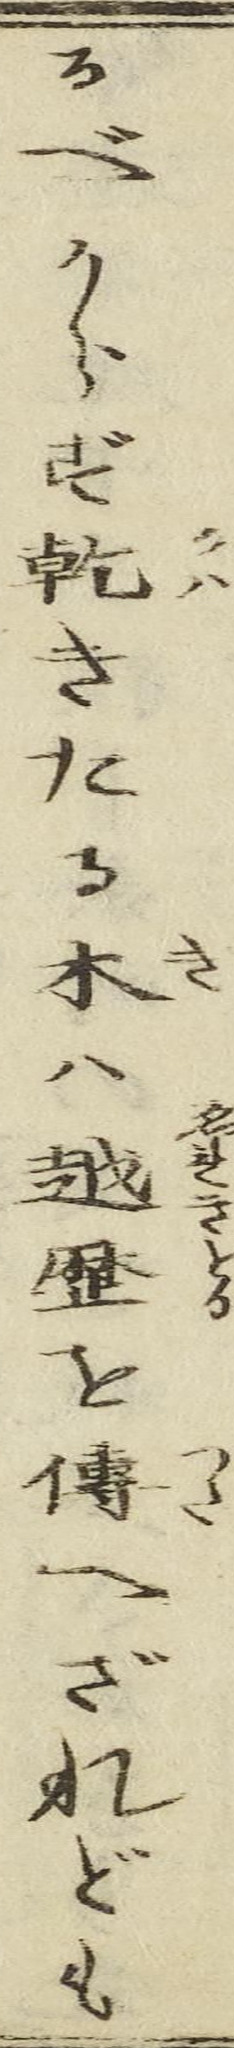るべからず乾きたる木は越歴を伝へざれども
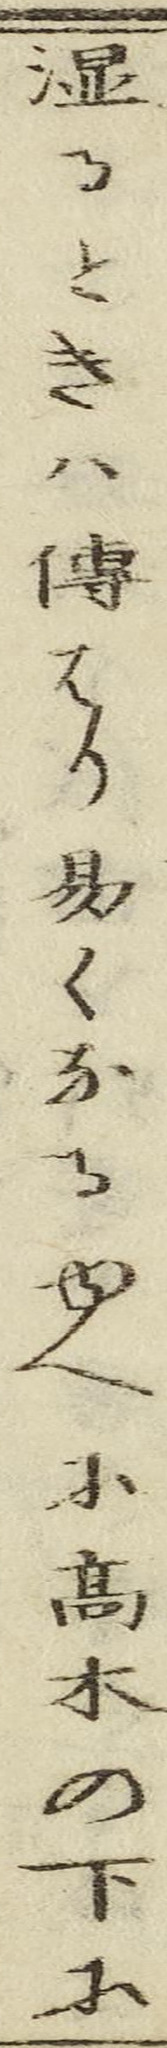湿るときは伝はり易くなるゆへに高木の下に
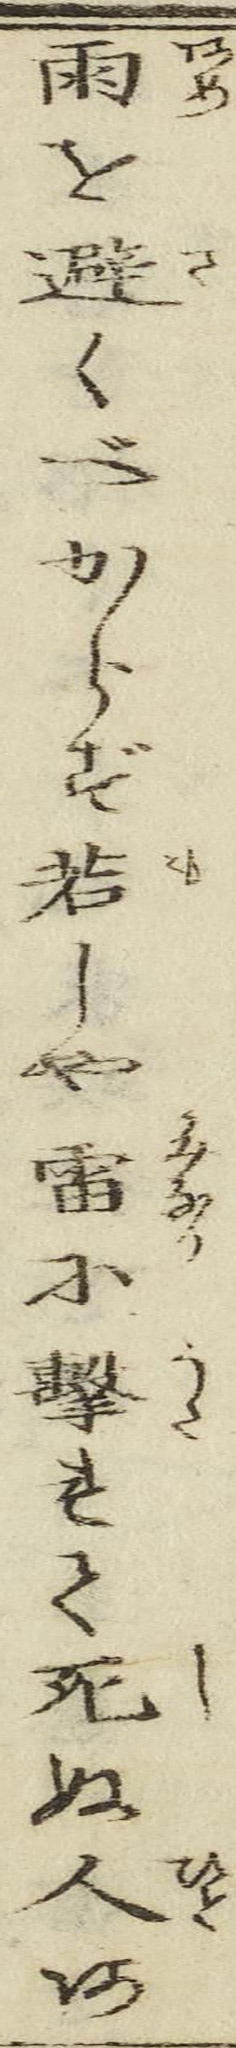雨を避くべからず若しや雷に撃れ死ぬ人あ
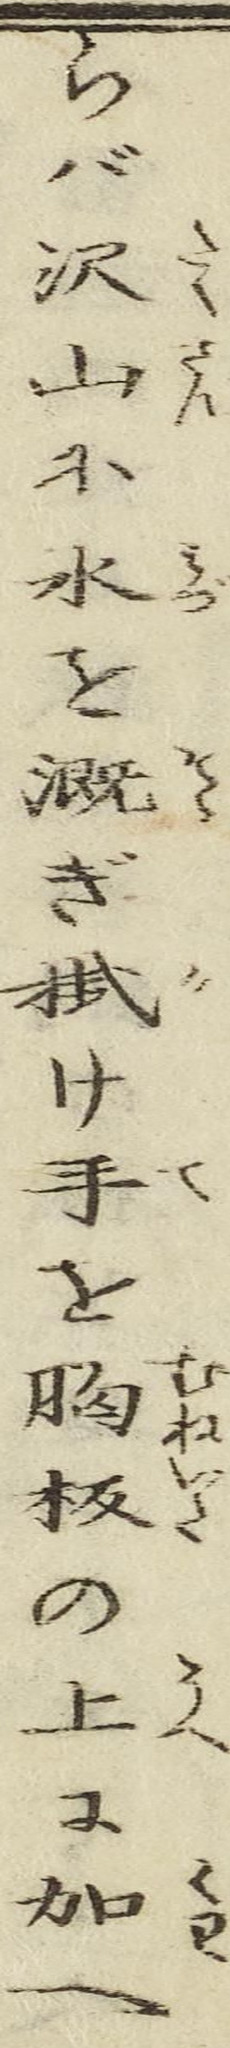らば沢山に水を漑ぎ掛け手を胸板の上に加へ
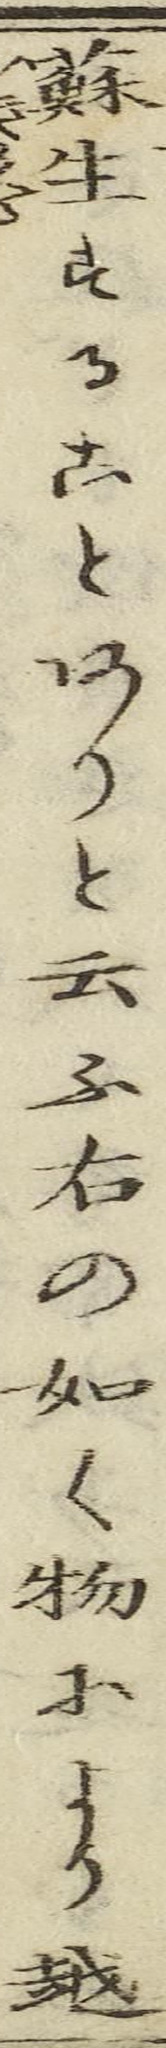蘇生することありと云ふ右の如く物により越
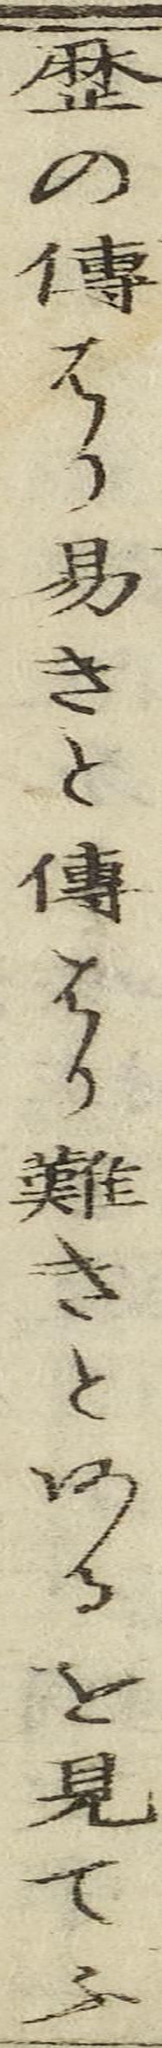歴の伝はり易きと伝はり難きとあるを見て「ふ
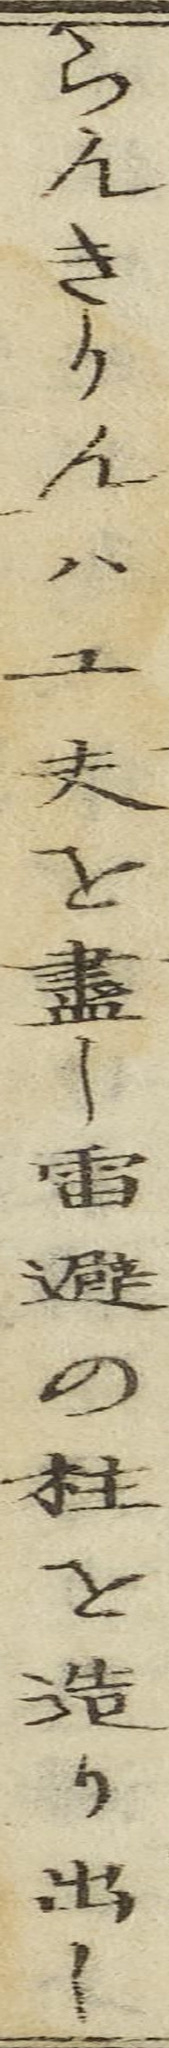らんきりん」は工夫を尽し雷避の柱を造り出し

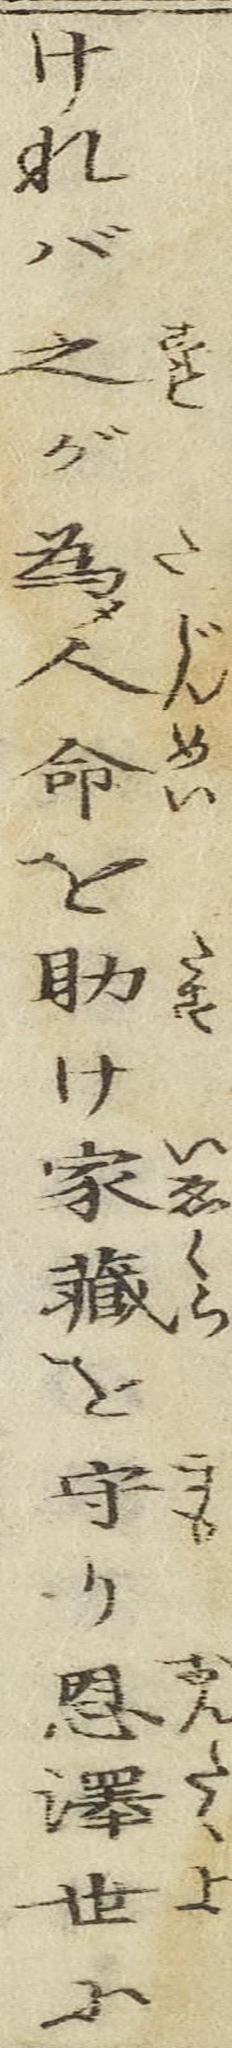ければ之が為メ人命を助け家蔵を守り恩沢世に
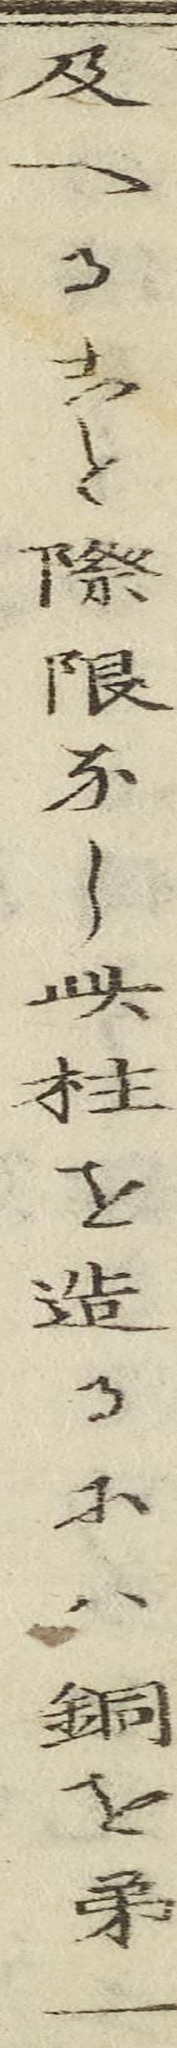及へること際限なし此柱を造るには銅を第一
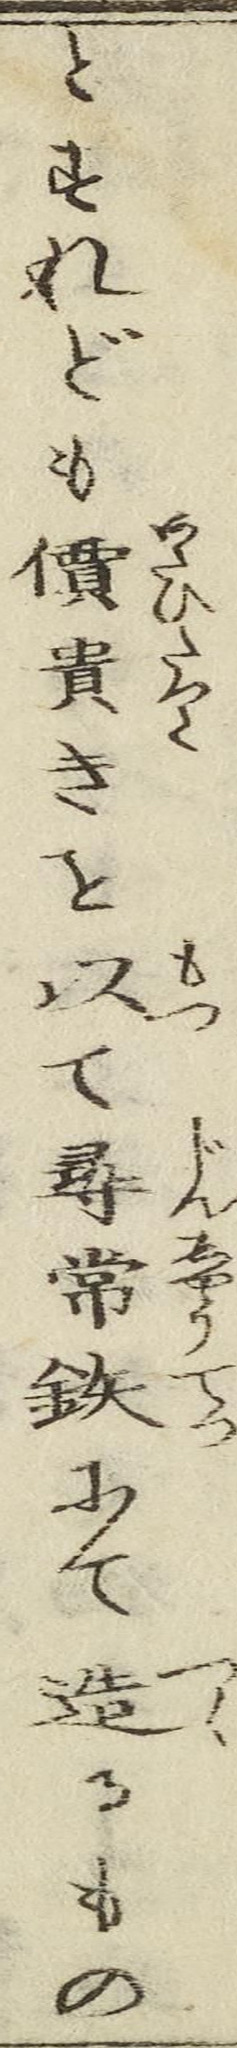とすれども値貴きを以て尋常鉄にて造るもの
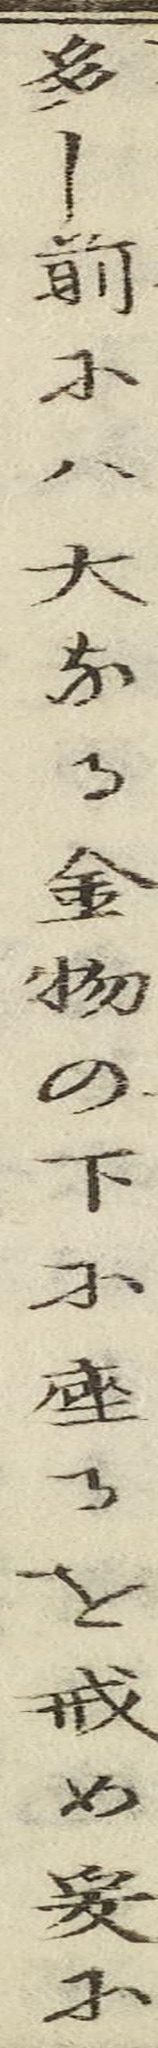多し前には大なる金物の下に座るを戒め爰に
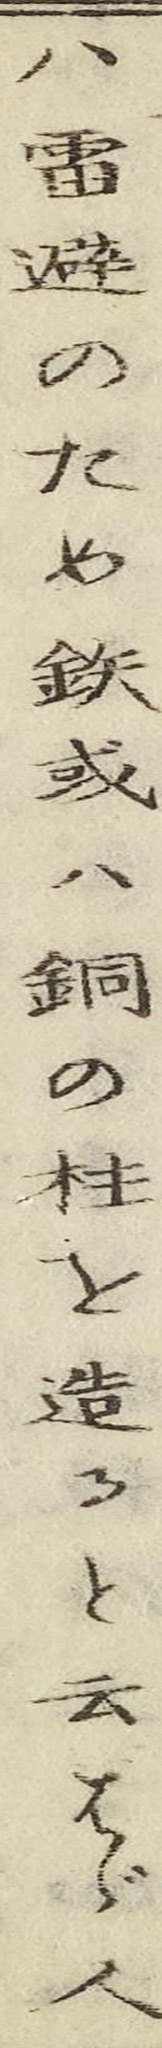は雷避のため鉄或は銅の柱を造ると云はゞ人
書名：天変地異
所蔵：東京大学地震研究所図書室 Earthquake Research Institute Library, The University of Tokyo, JAPAN
